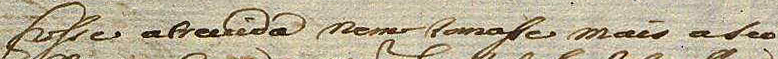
fosse atreuida nem tomasse mais a seo
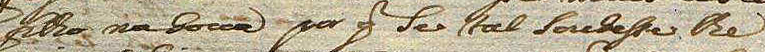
filho na bocca porq̄ se tal soubesse lhe
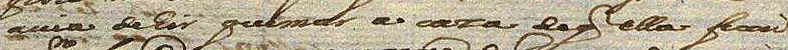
auia de hir quemar a caza de q̄ ella ficou
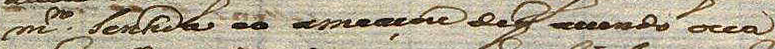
mto. sentida e o ameaçou de q̄ auendo occa
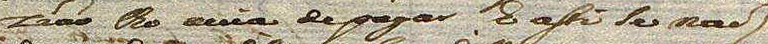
ziaõ lho auia de pagar E assi se naõ
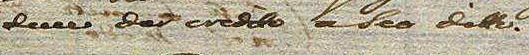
deue dar credito a seo ditto.
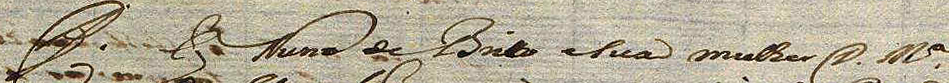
P. Q̄ Nuno de Britto e sua mulher D. Ma.
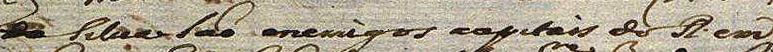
da silua saõ enemigos capitais do R. em
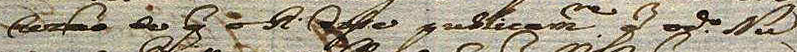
Rezão de q̄ o R. disse publicamte. q̄ o d.o Nu
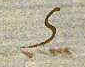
5
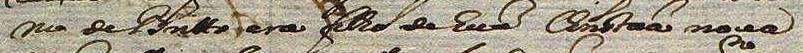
no de Britto era filho de huā Christaā noua
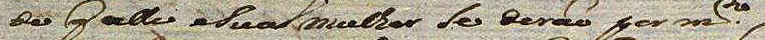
de q̄ elle e sua mulher se derão por m.to
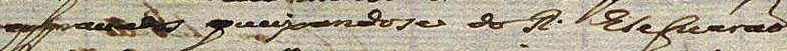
aggrauados queixandose do R. E se ficarão
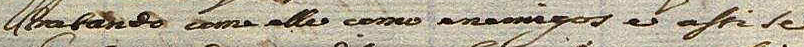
tratando com elle como enemigos e assi se
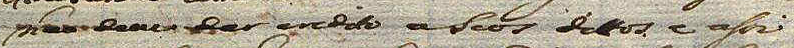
não deue dar credito a seos dittos e assi
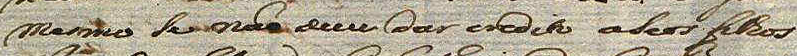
mesmo se não deue dar credito a seos filhos
